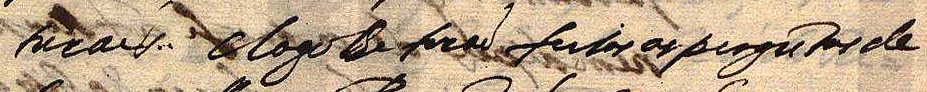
turaes; E logo lhe foraõ feitas as pergūtas de
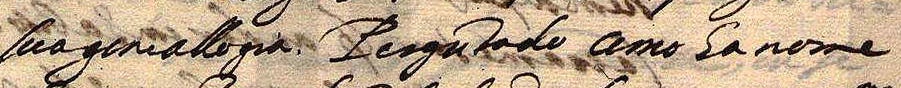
sua genealogia. Pergūtado como ha nome
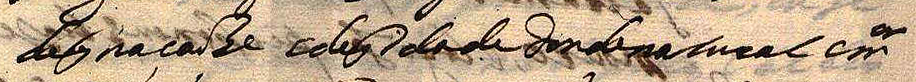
de q̄ naçaõ he E de q̄ idade donde natural e m.or
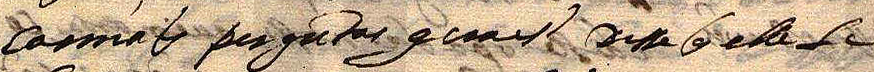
E as mais pergūtas geraes? Disse q̄ elle se
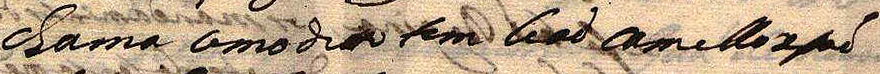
chama como ditto tem leaõ camello xpaõ
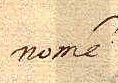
nome
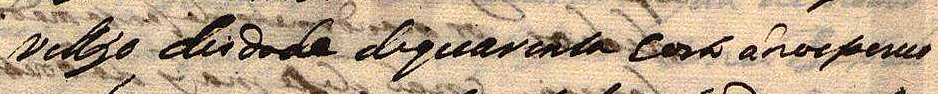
vellho de idade de quarenta E oito an̄os pouco
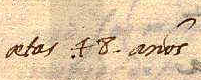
ætas .48. anōs
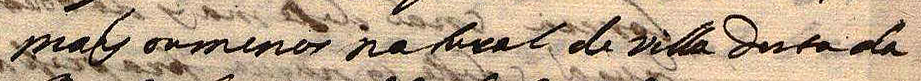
mais ou menos natural de villa desta da
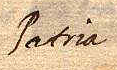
Patria
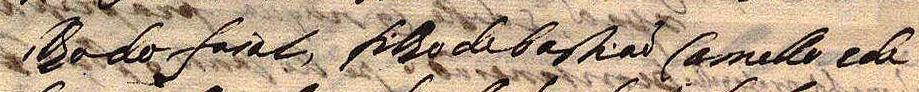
ilha do faial, filho de bastiaõ Camello e de
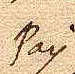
Pay
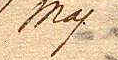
Maj
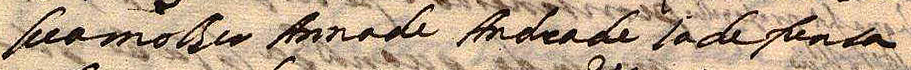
sua molher Anna de Andrade ja defunta
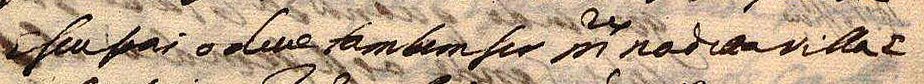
E seu pai o deue tambem ser m.res na ditta villa E
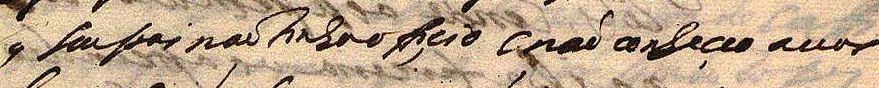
q̄ seu pai naõ tinha officio e naõ conheceo auos
